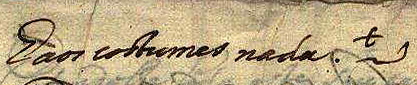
E aos costumes nada.
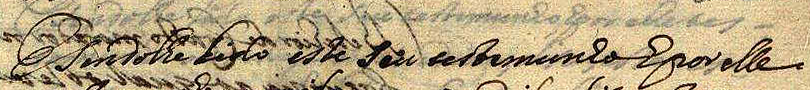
E sendolhe lido este seu testemunho E por elle
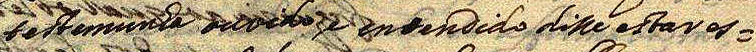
testemunha ouvido, e entendido disse estar es
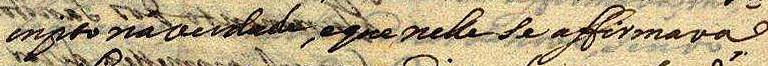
cripto na verdade, e que nelle se affirmava
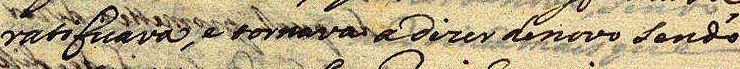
ratificava, e tornava a dizer de novo sendo
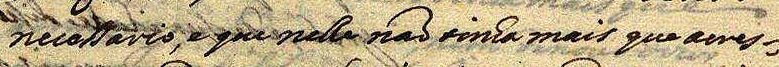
necessario, e que nelle naõ tinha mais que acres
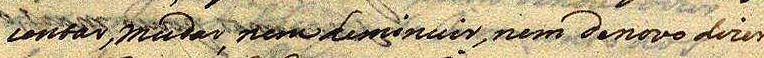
centar, mudar, nem deminuir, nem de novo dizer
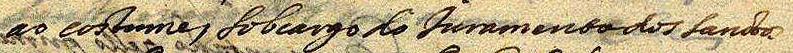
ao costumes sob cargo do Iuramento dos sanctos
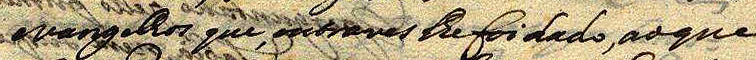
evangelhos que, outra ves lhe foi dado, ao que
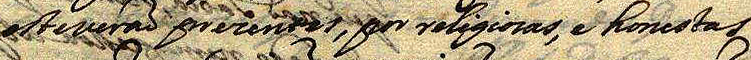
esteveraõ prezentes, por religiozas, e honestas
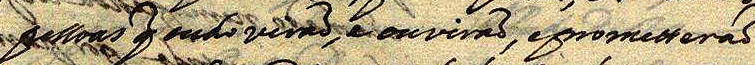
pessoas q̄ tudo virão, e ouviraõ, e prometteraõ
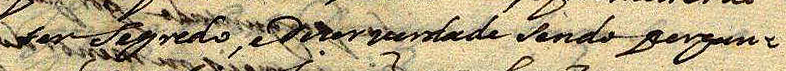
ter Segredo, e dizer verdade, sendo pergun
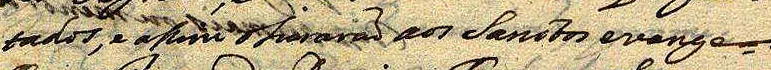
tados, e assim o Iuraraõ aos Sanctos evange
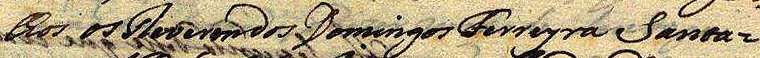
lhos os Reverendos Domingos Ferreyra Santa
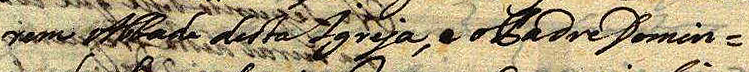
rem Abbade desta Igreja, e o Padre Domin
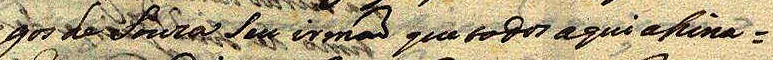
gos de Souza seu irmaõ que todos aqui assina
